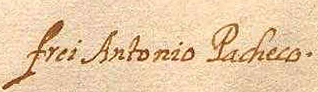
frei Antonio Pacheco.
